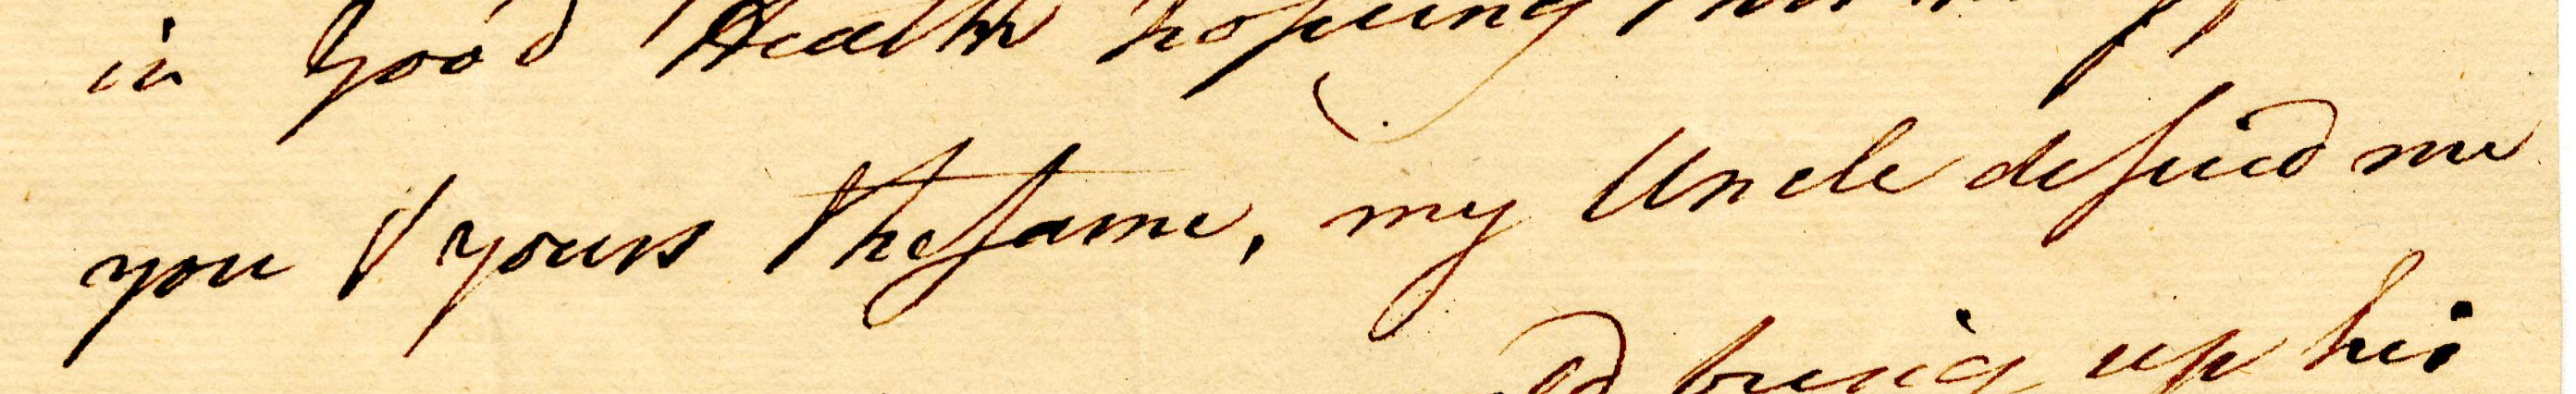you & yours the same, my Uncle desired me
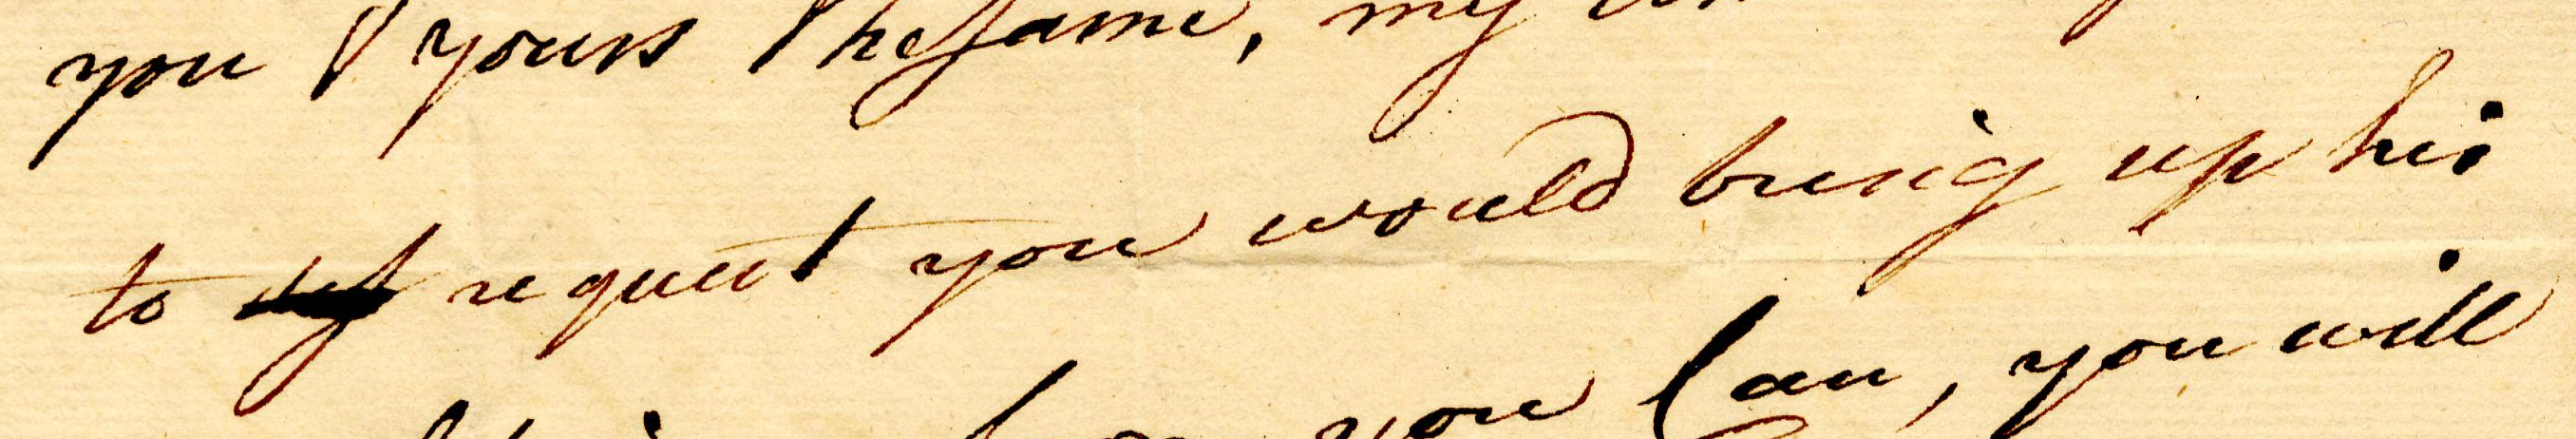to [___] request you would bring up his
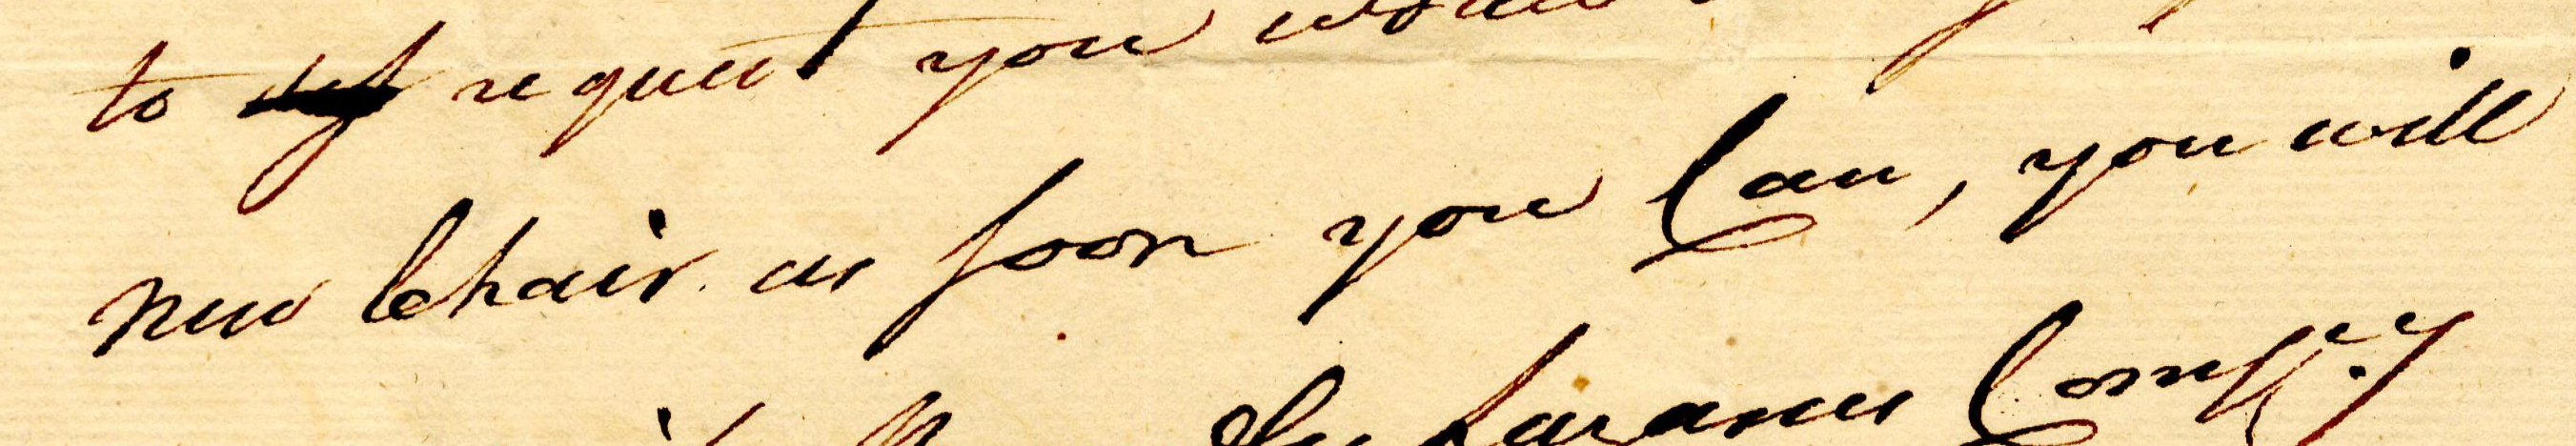new lehair as soon you Can, you will
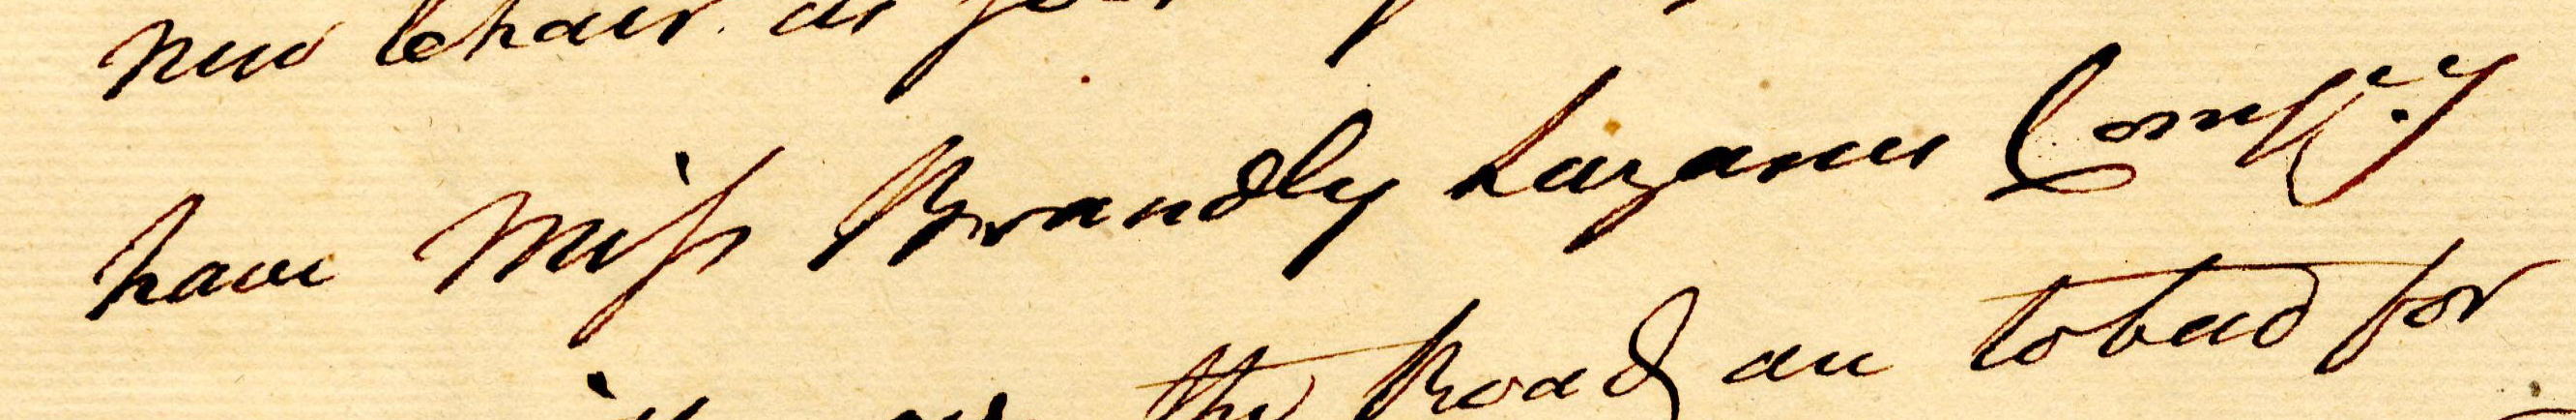have Miss Brandly Lazarus Comp^y.
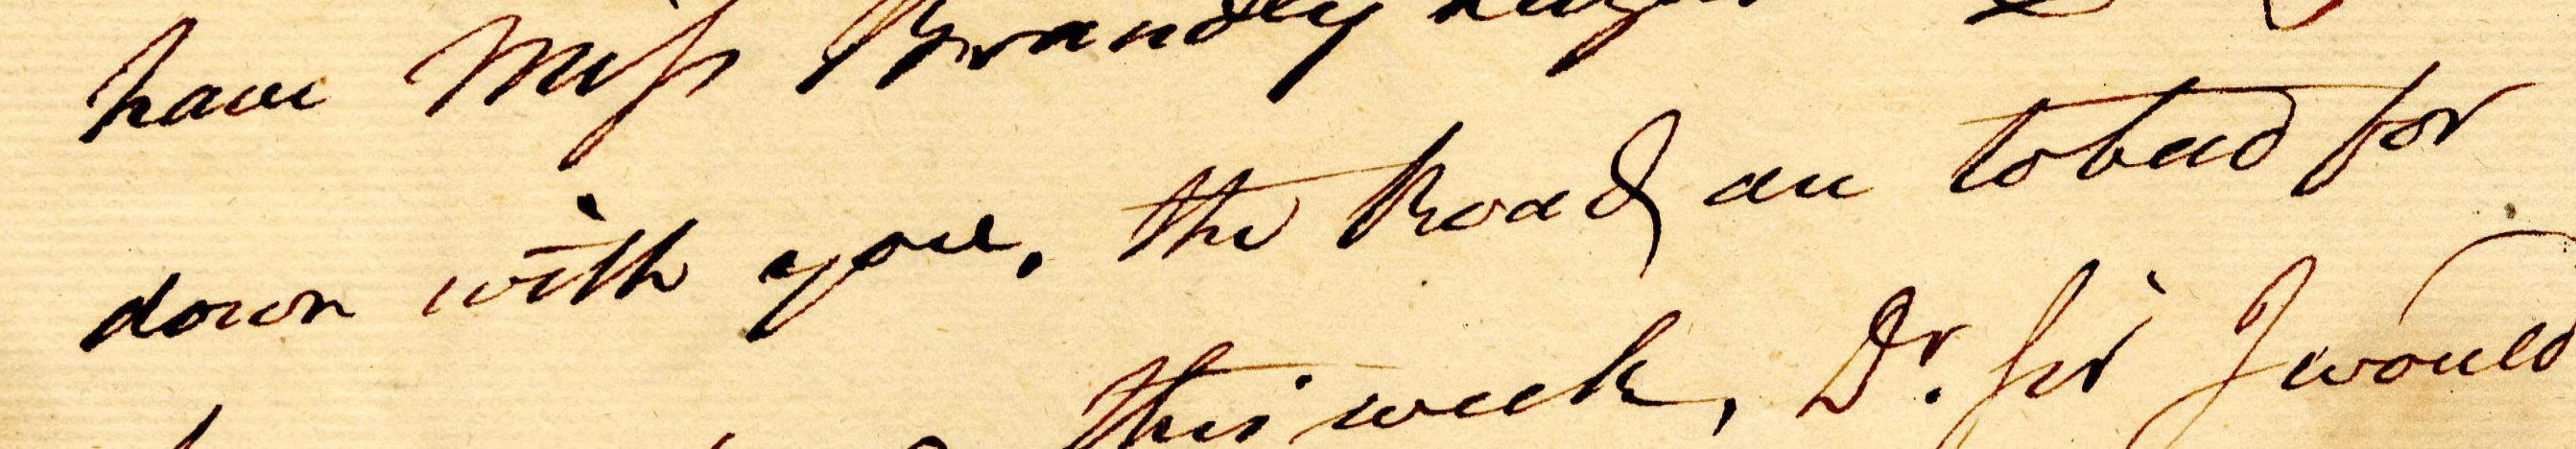down with you, the road are to bad for
